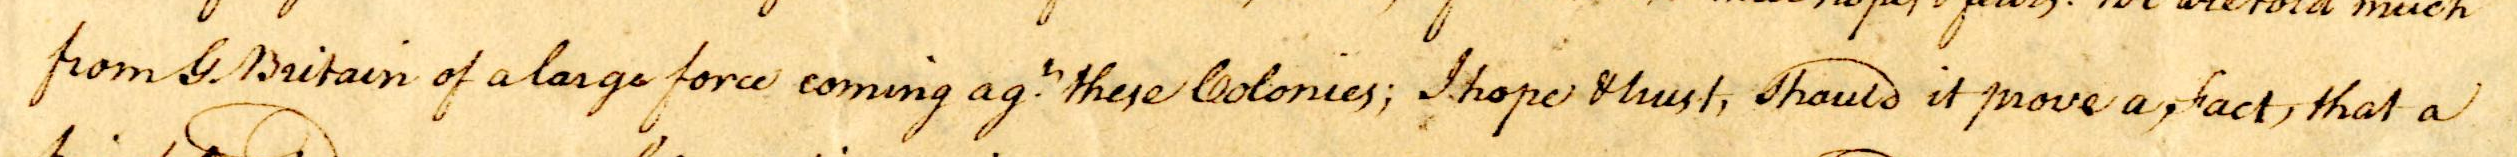from G. Britain of a large force coming ag^t. these Colonies; I hope & trust, should it prove a, fact, that a
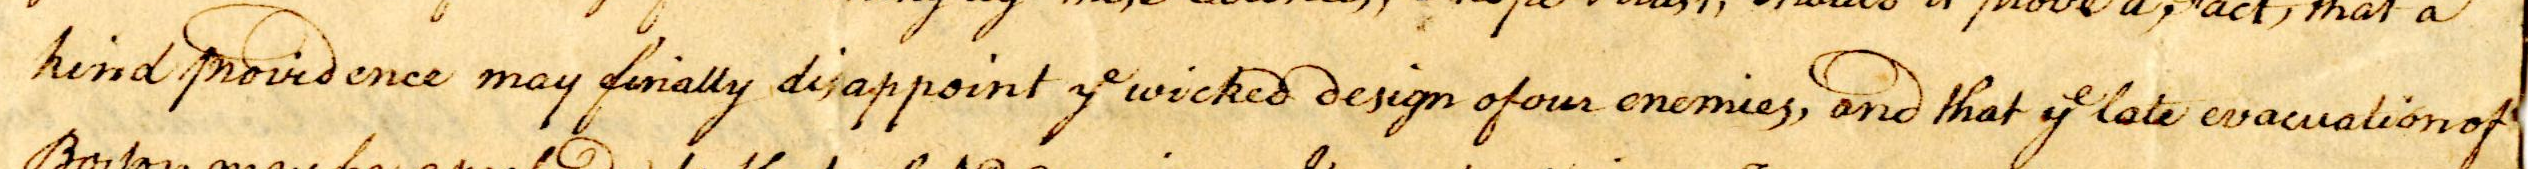kind providence may finally disappoint y^e wicked design of our enemies, and that y^e late evacuation of
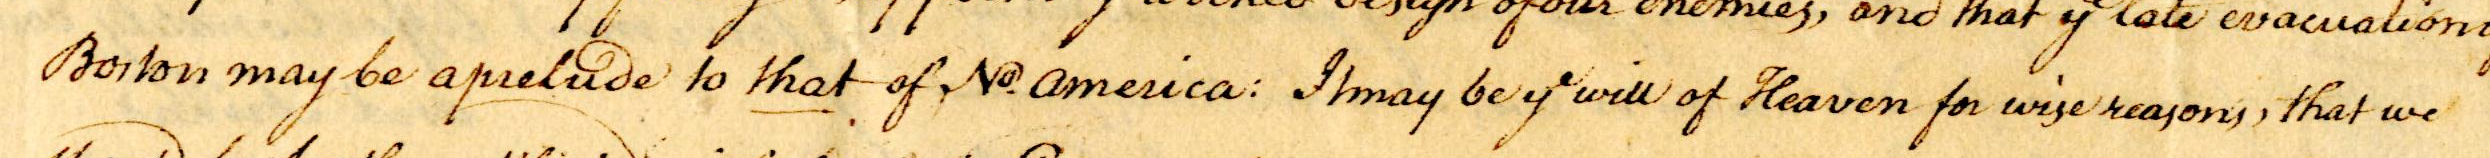Boston may be a prelude to that of No. America: I may be y^e will of Heaven for wise reasons, that we
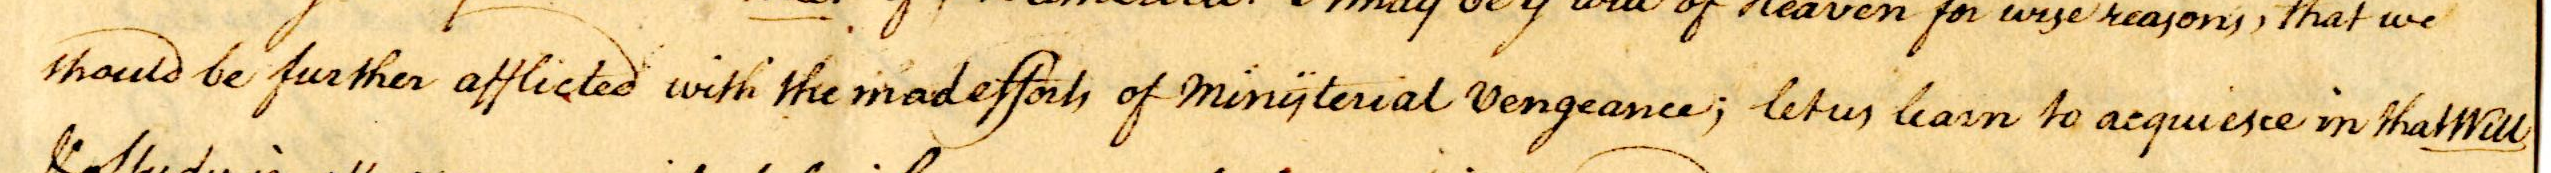should be further afflicted with the mad efforts of ministerial vengeance; let us learn to acquiesce in that Will
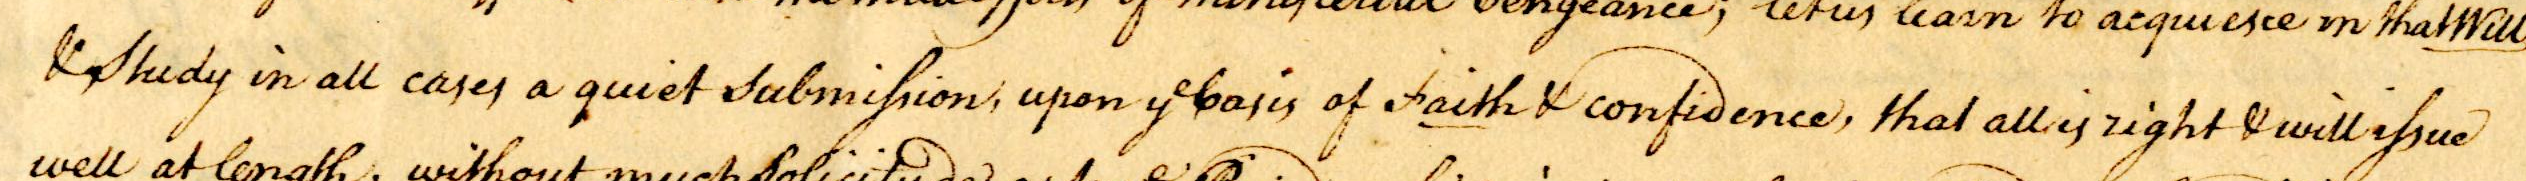& Study in all cases a quiet Submission, upon y^e basis of Faith & confidence, that all is right & will issue
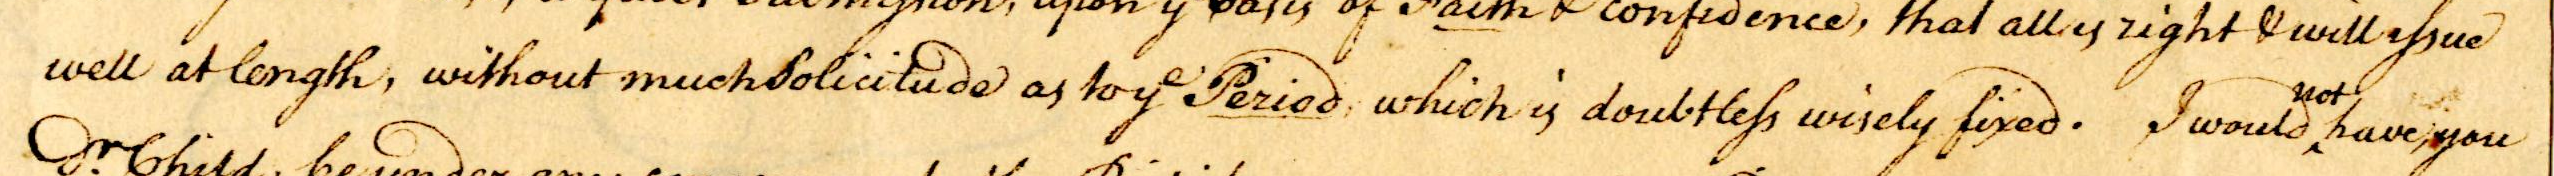well at length, without much Solicitude as to y^e Period which is doubtless wisely fixed. I would have you
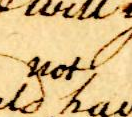not
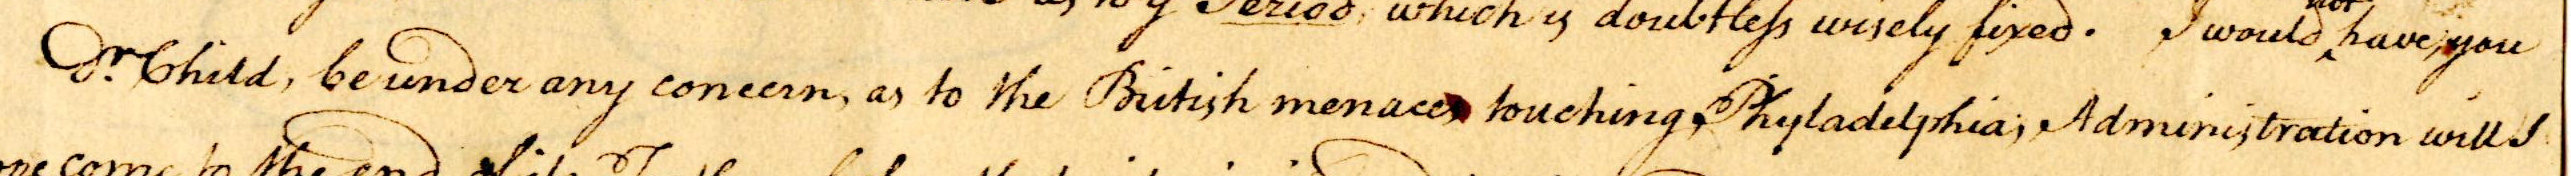D.^r. Child, be under any concern, as to the British menaces touching Phyladelphia, Administration will I
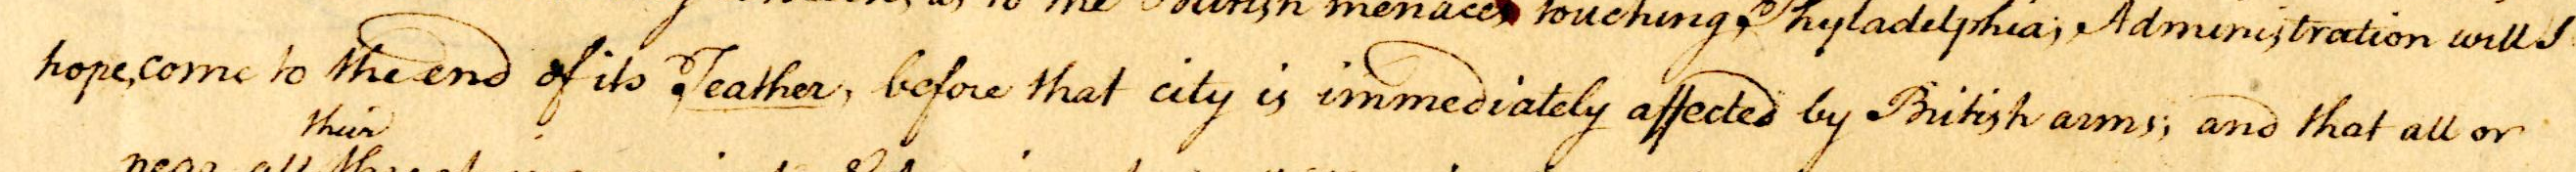hope, come to the end of its Feather, before that city is immediately affected by British arms; and that all or
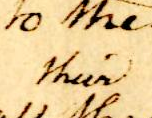their
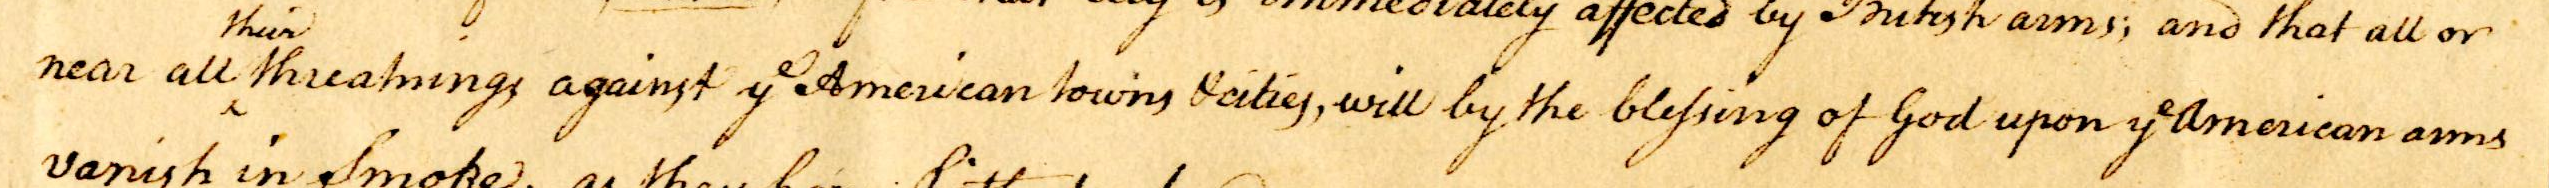near all ^ threatnings against y^e American towns & cities, will by the blessing of God upon y^e American arms
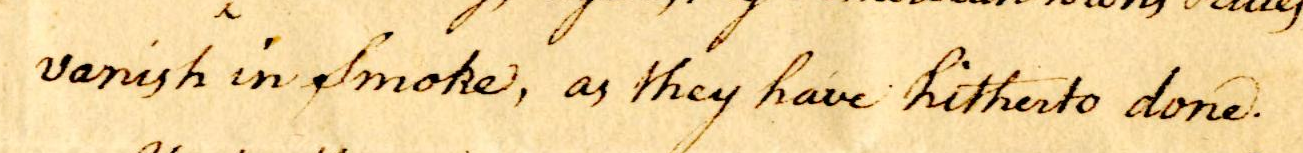vanish in Smoke, as they have hitherto done.
